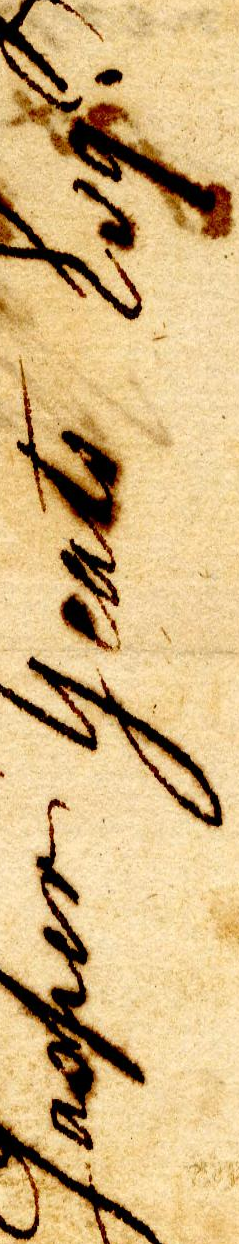Jasper Yeats Esq^r.
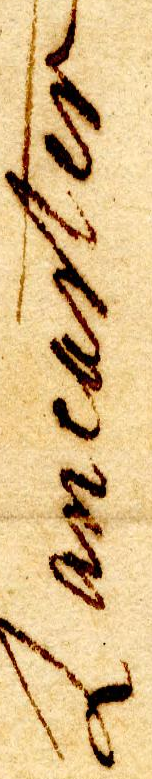Lancaster
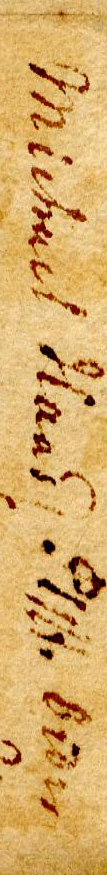Michael Haas Plll Order
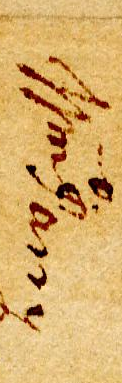W^m Parry
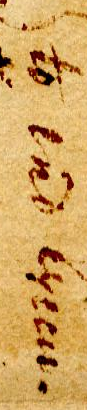to end excise
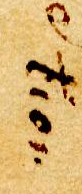to
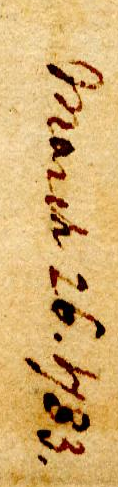March 26. 1783.
